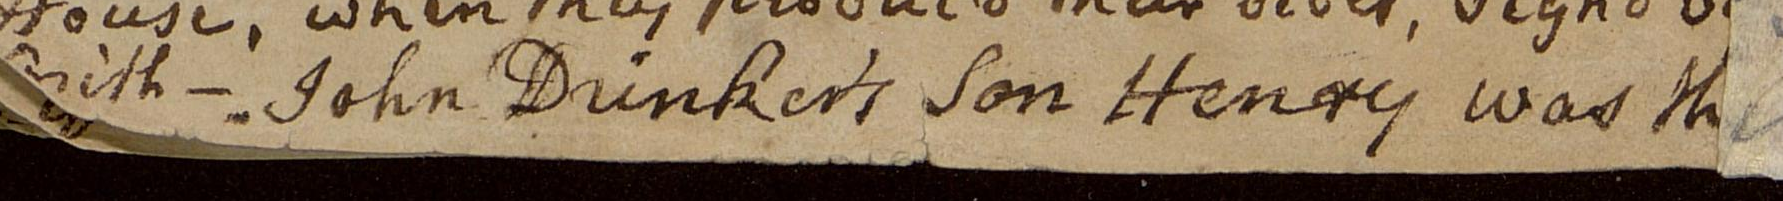mith- John Drinker's Son Henry was the
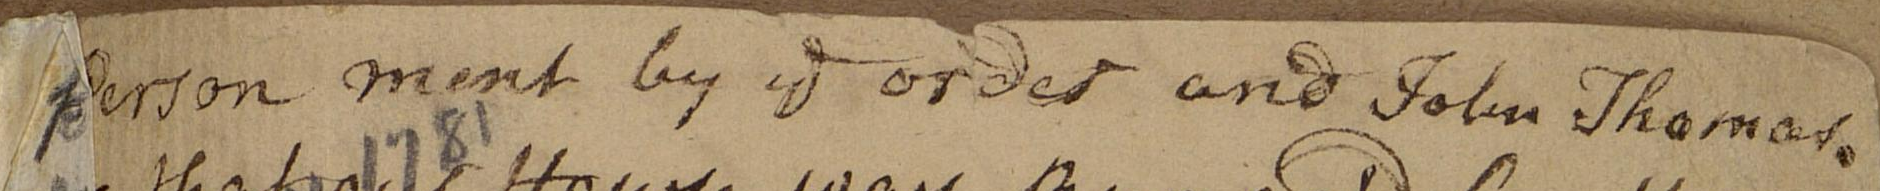Person ment by y^e order and John Thomas,
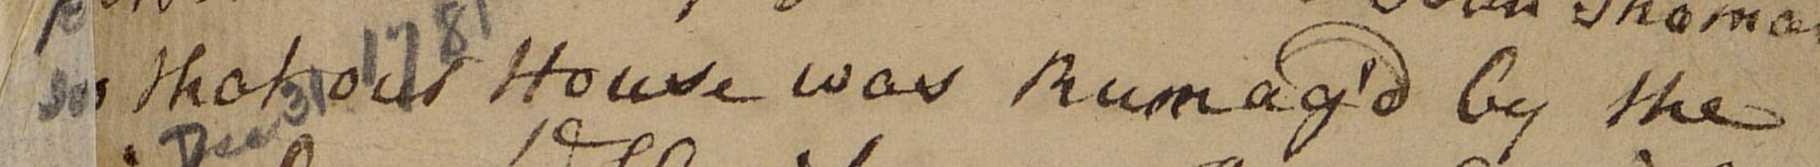so that our House was Rumag'd by the
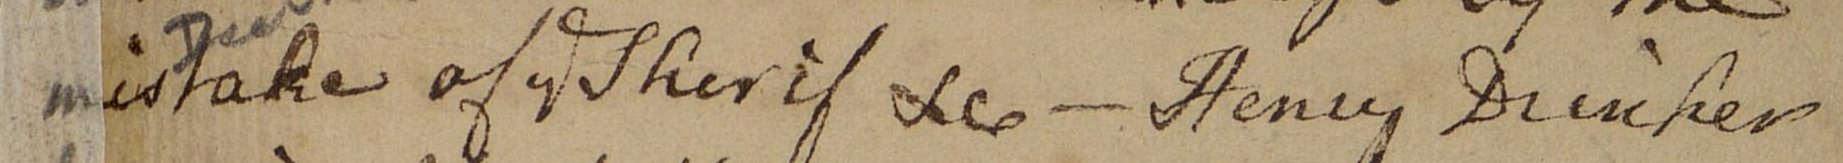mistake of y^e Sherif &c- Henry Drinker
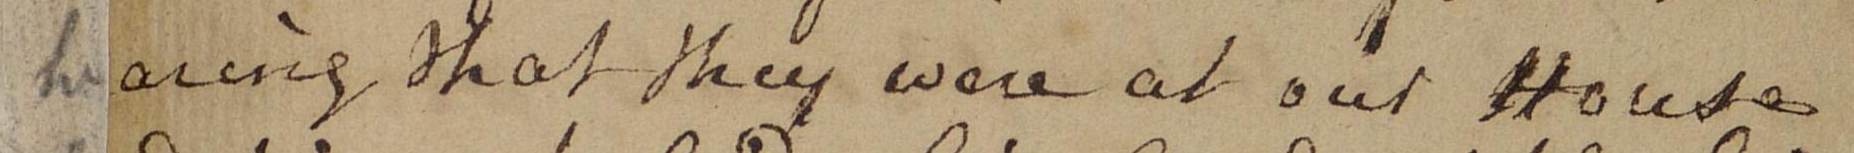hearing that they were at our House
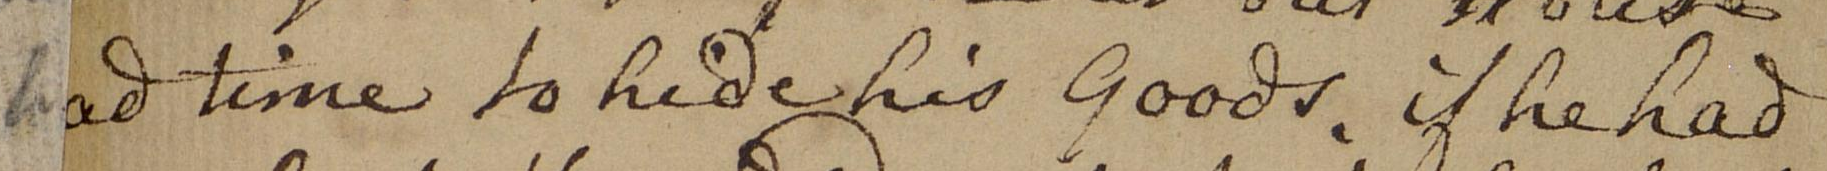had time to hide his Goods, if he had
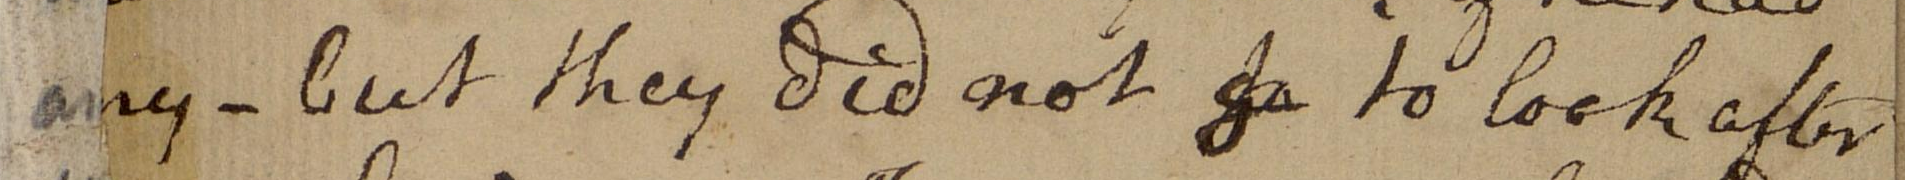any- but they did not go to look after
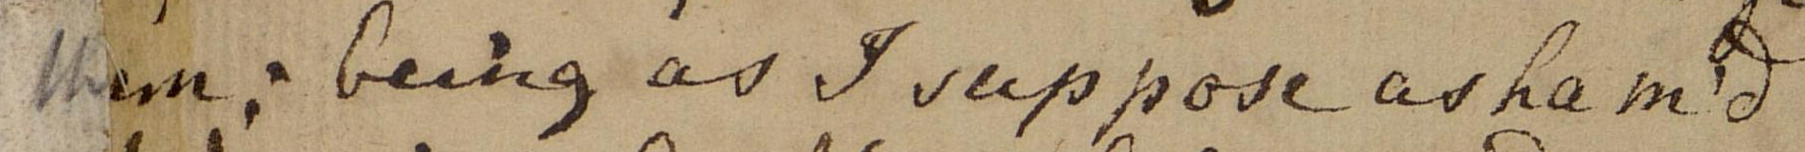them; being as I suppose asham'd
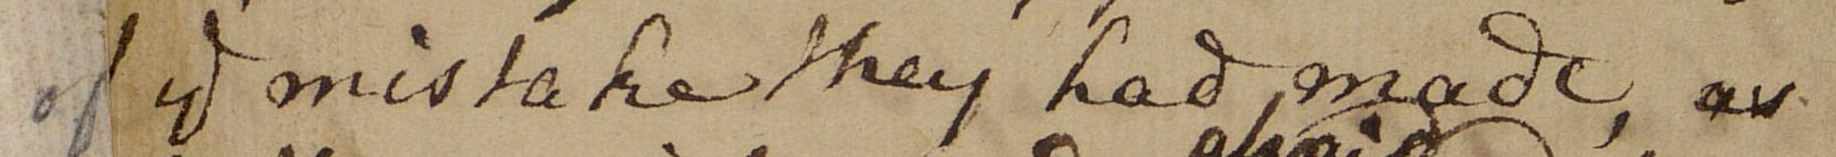of y^e mistake they had made, as
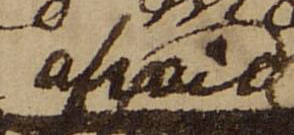afraid
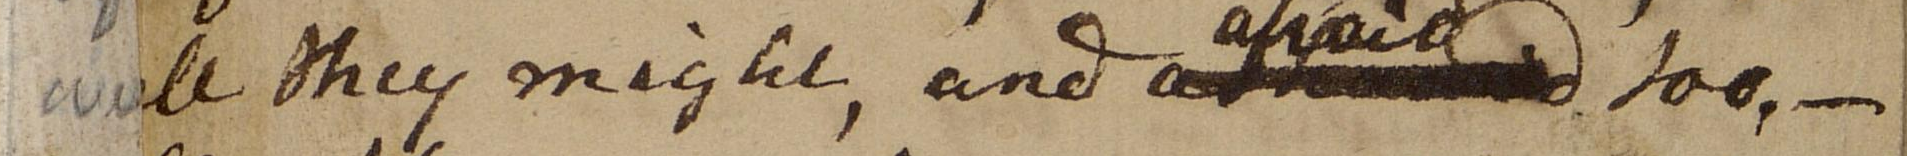well they might, and [asham'd] too,-
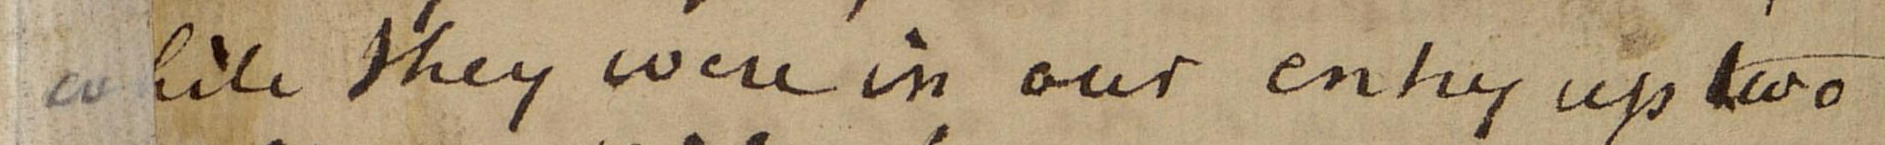while they were in our entry up two
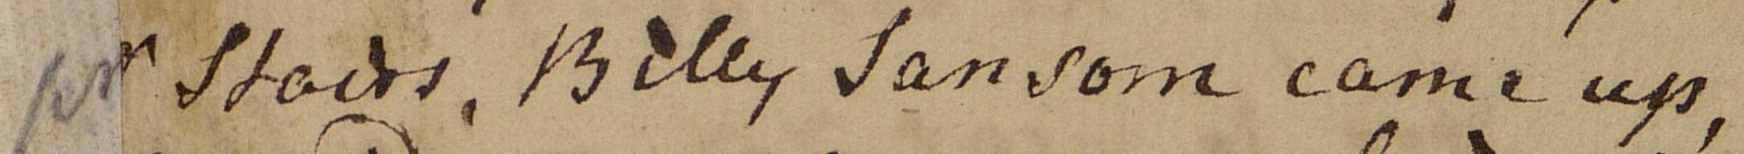p^r Stairs, Billy Sansom came up,
